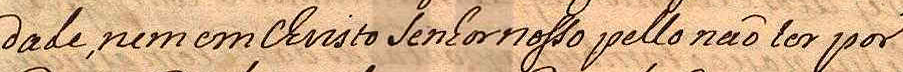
dade, nem em Christo senhor nosso pello naõ ter por
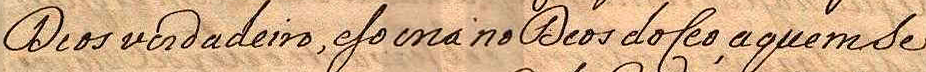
Deos verdadeiro, e so cria no Deos do Ceo, a quem Se
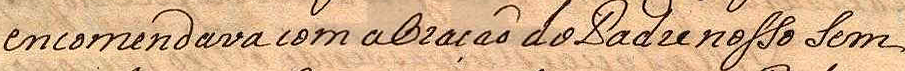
encomendava com a Oração do Padre nosso Sem
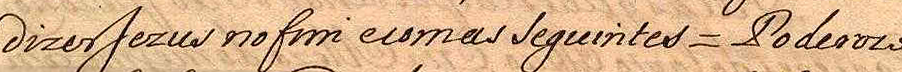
dizer Jezus no fim e com as seguintes= Poderozo
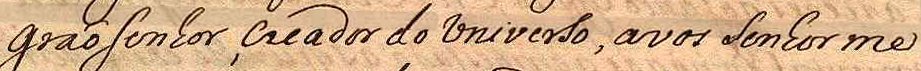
graõ senhor, creador do vniverso, a vos senhor me
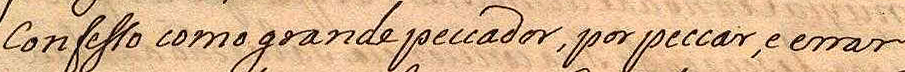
Confesso como grande peccador, por peccar, e errar
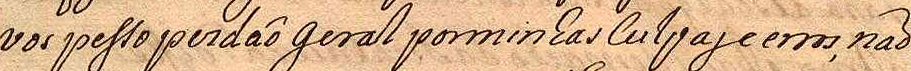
vos pesso perdaõ geral por minhas Culpas e erros, naõ
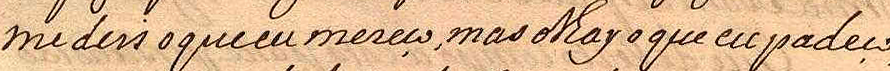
me deis o que eu mereço, mas olhay o que eu padeço,
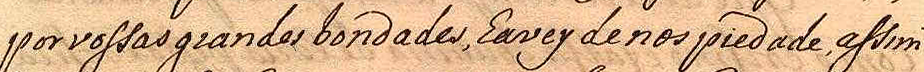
por vossas grandes bondades, havey de nos piedade, assim
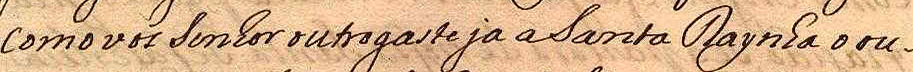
como voz Senhor outrogaste ja a Santa Raynha o ou
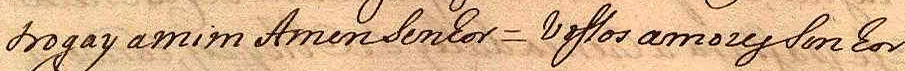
trogay a mim Amen Senhor= Vossos amores Senhor
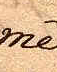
me
